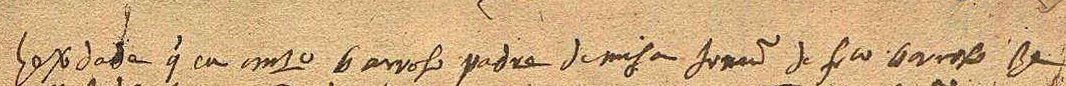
he ꝟdade q̄ eu anto barroso padre de misa Jrmaõ de frco barroso Re
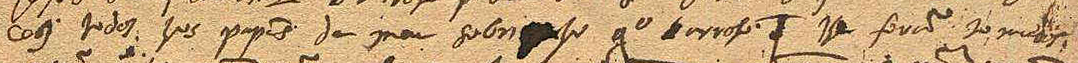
cebj todos hos papes de meu sobrinho go barroso q̄ lhe forão tomados
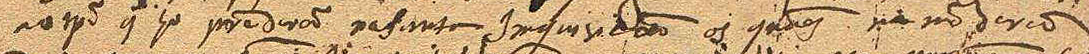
ao tpō q̄ ho prēderão na Sancta Jmquisição os quaes me mādarão
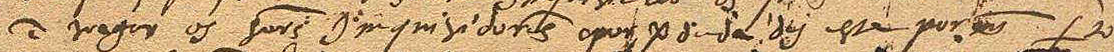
ētregar os sōrs Jmquisidores e por ꝟdade dej este por mj̄ fto
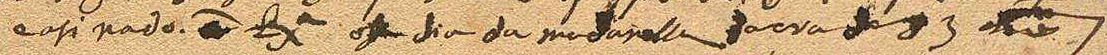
e asinado. ē Lxa oJe dia da madanella era de 83 anos
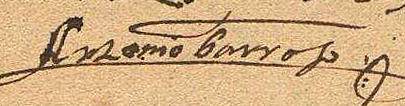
Antonio barroso
